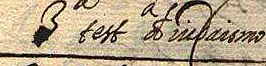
3ª testa d̄ iudaismo
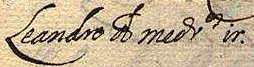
Leandro d̄ medros ir.
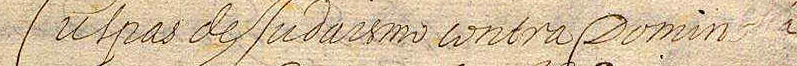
Culpas de Judaismo contra Domin
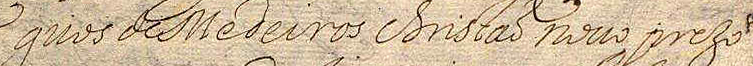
guos de Medeiros christaõ nouo prezo
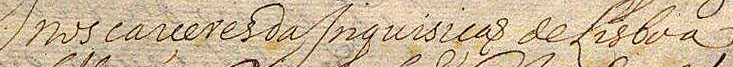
nos carçeres da Jnquisiçaõ de Lisboa,
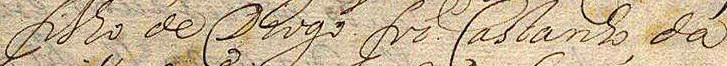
filho de Diogo frz̄ Castanho da
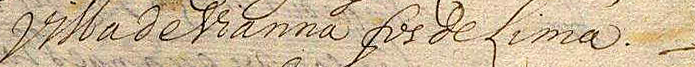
villa de vianna fos de Lima.
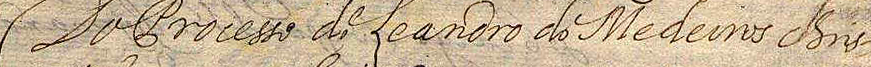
Do processo de Leandro de Medeiros chris
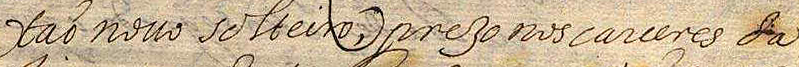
taõ nouo solteiro, prezo nos carçeres da
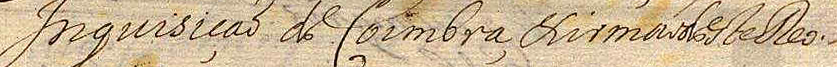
Jnquisiçaõ de Coimbra, & irmaõ deste Reo.
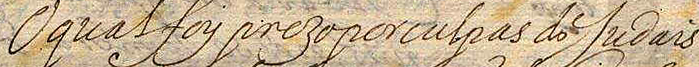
O qual foy prezo por culpas do Judais
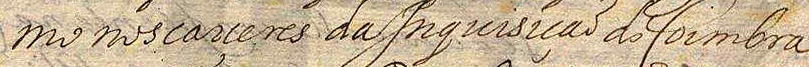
mo nos carçeres da Jnquisiçaõ de Coimbra
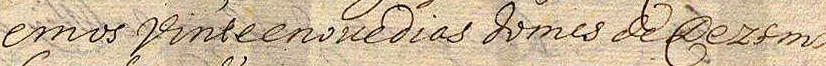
em os vinte e noue dias do mes de Dezem
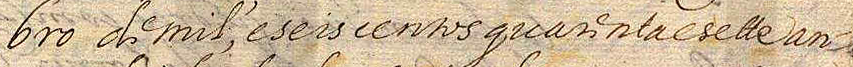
bro de mil, e seiscentos quarenta e sette an
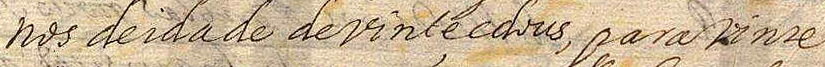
nos de idade de vinte, e dous, para vinte
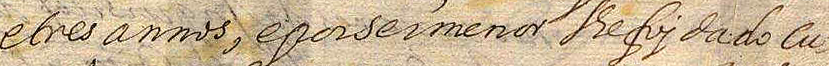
e tres annos, e por ser menor lhe foj dado Cu
